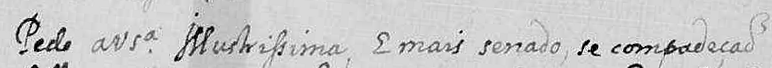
Pede a v s.a Illustrissima, E mais senado, se compadeçaõ
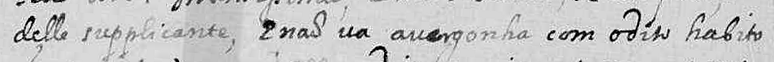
delle supplicante, E naõ ua a uergonha com o dito habito
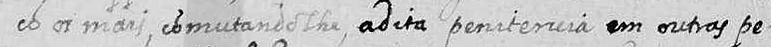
cō os mais cōmutandolhe, a dita penitencia em outras pe
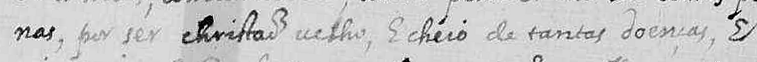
nas, por ser christaõ uelho, E cheio de tantas doenças, E
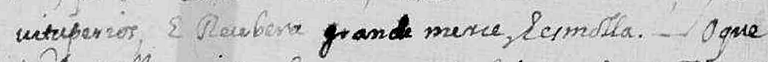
uituperios, e Recebera grande merce, E esmolla. O que
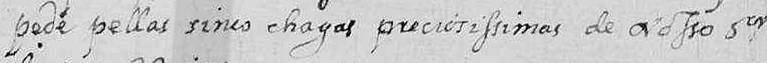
pede pellas sinco chagas preciozissimas de Nosso sor.
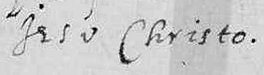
Jesv Christo.
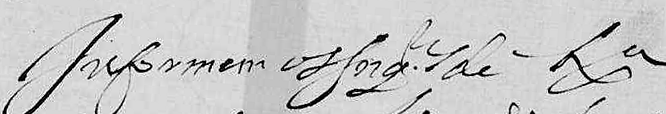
Jnformem os Jnq.res de Lxa
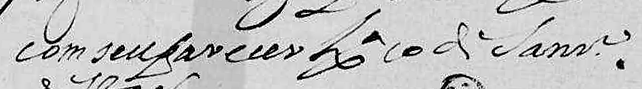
com seu parecer Lxa 10 de Ianr.o
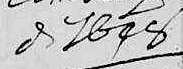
d 1648
